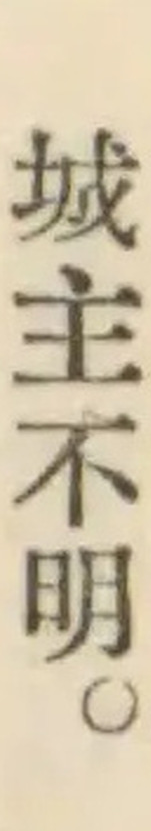城主不明。
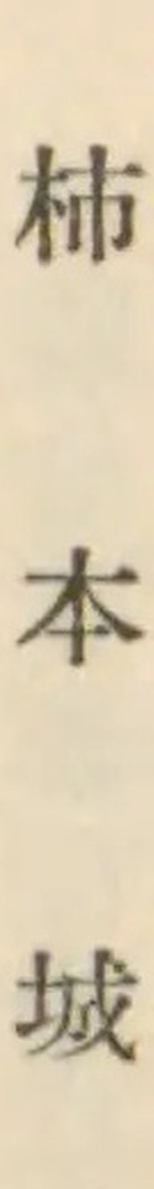柿本城
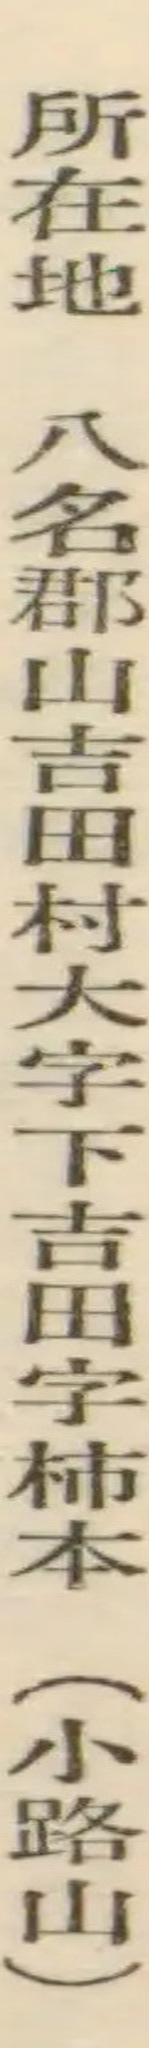所在地八名郡山吉田村大字下吉田字柿本(小路山)
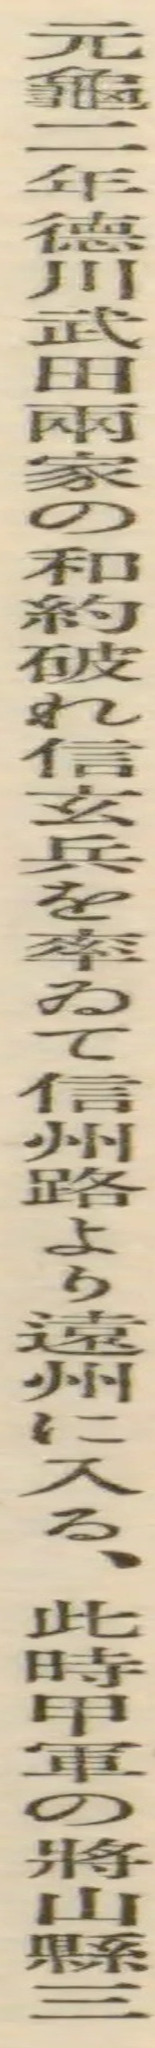元亀二年徳川武田両家の和約破れ信玄兵を率ゐて信州路より遠州に入る、此時甲軍の将山縣三
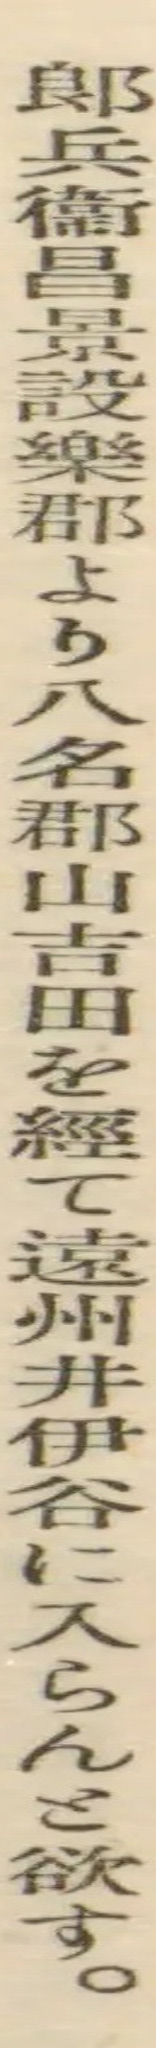郎兵衛昌景設楽郡より八名郡山吉田をへ経て遠州井伊谷に入らんと欲す。

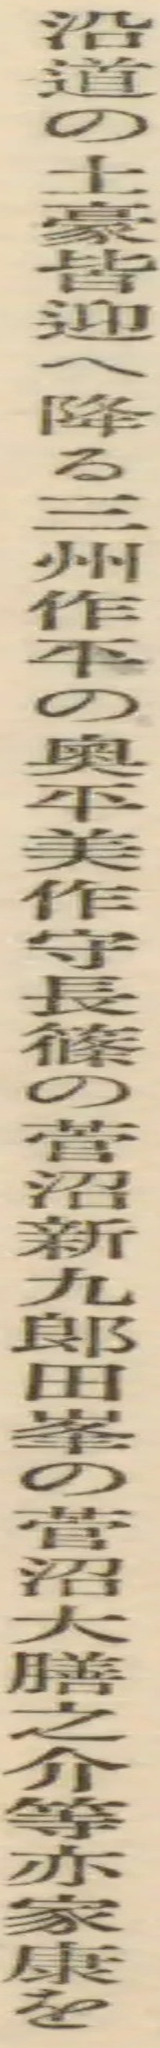沿道の士豪皆迎へ降る三州作平の奥平美作守長篠の菅沼新九郎田峯の菅沼大膳之介等亦家康を
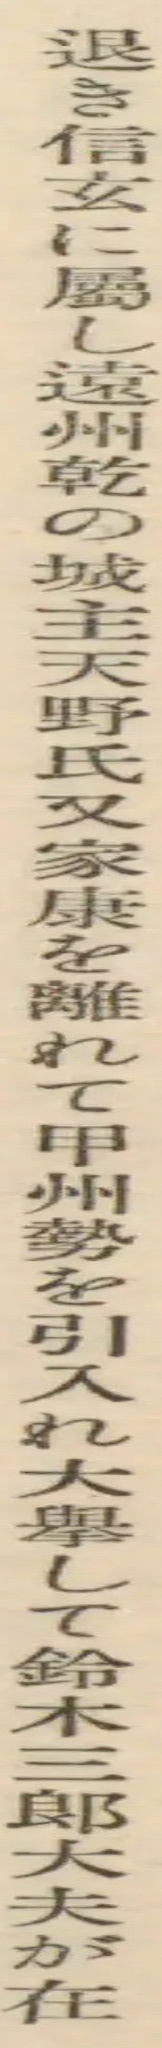退き信玄に属し遠州乾の城主天野氏又家康を離れて甲州勢を引入れ大挙して鈴木三郎大夫が在
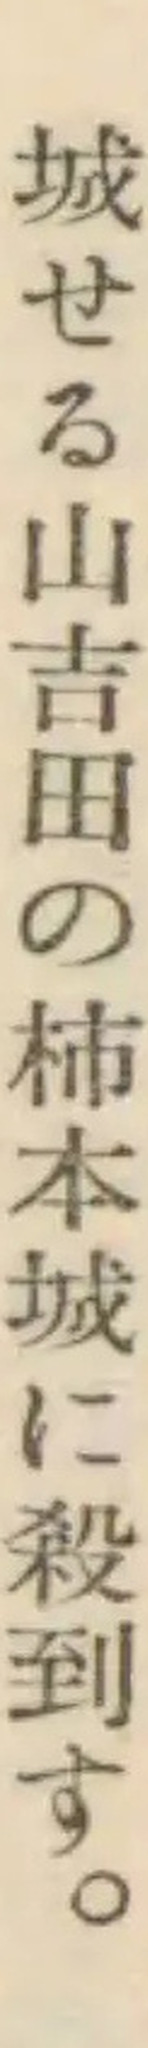城せる山吉田の柿本城に殺到す。
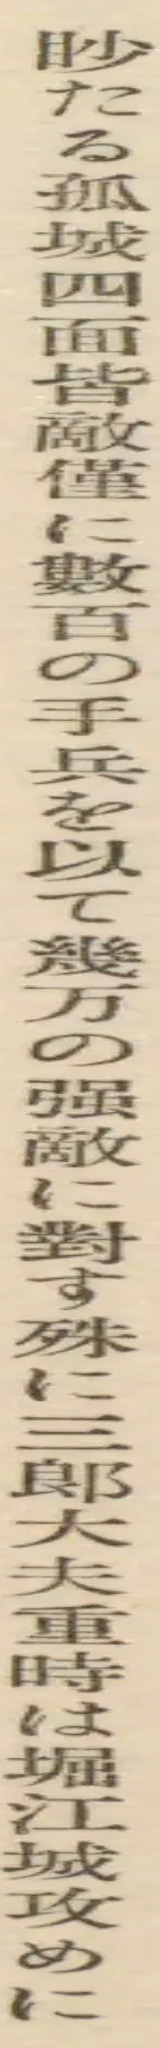眇たる孤城四面皆敵僅に数百の手兵を以て幾万の強敵に対す殊に三郎大夫重時は堀江城攻めに
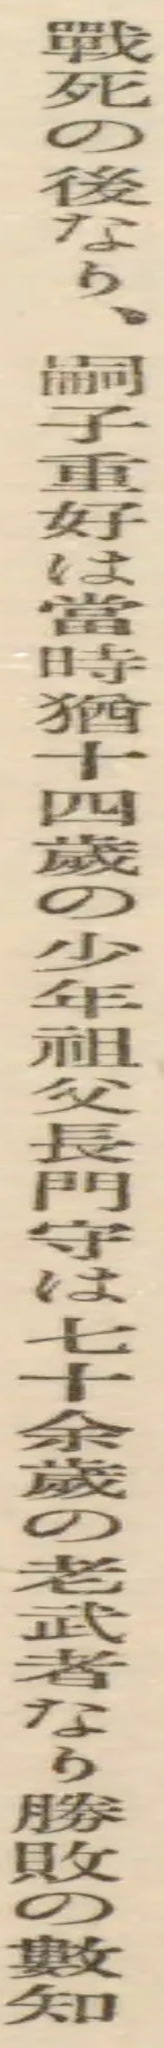戦死の後なり、嗣子重好は当時猶十四歳の少年祖父長門守は七十余歳の老武者なり勝敗の数知
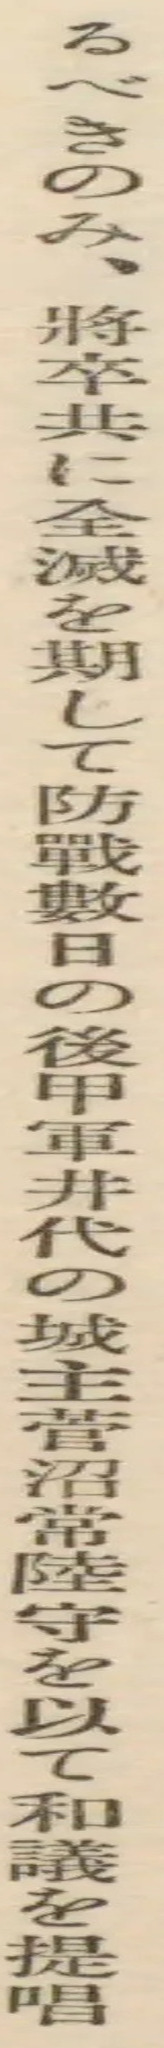るべきのみ、将卒共に全滅を期して防戦数日の後甲軍井代の城主菅沼常陸守を以て和議を提唱
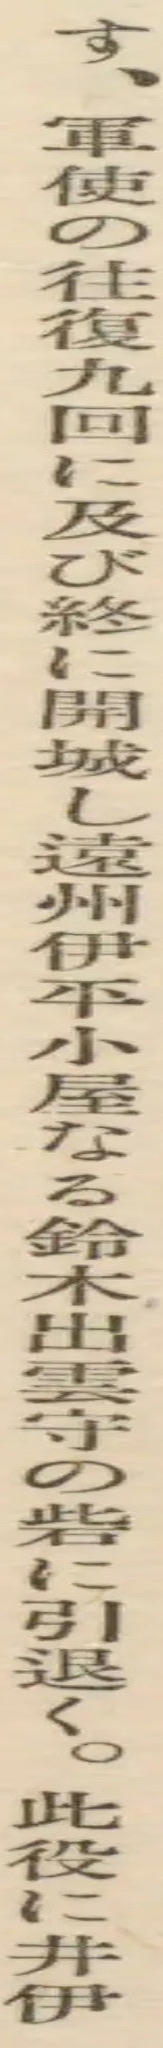す、軍使の往復九回に及び終に開城し遠州伊平小屋なる鈴木出雲守の砦に引退く。此役に井伊
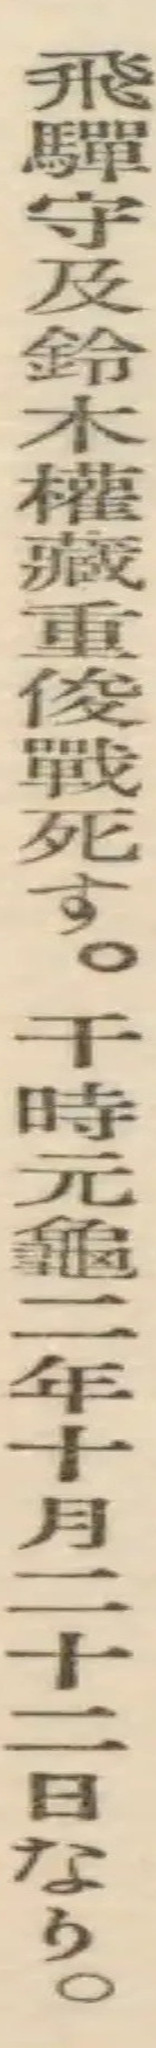飛騨守及鈴木権蔵重俊戦死す。于時元亀二年十月二十二日なり。
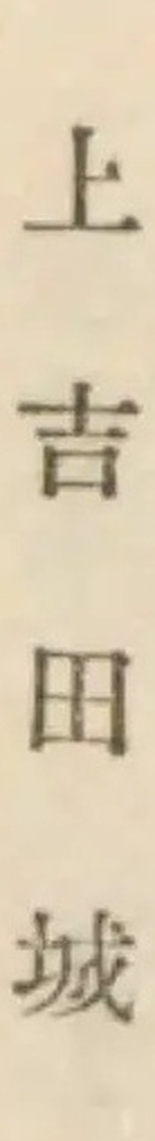上吉田城
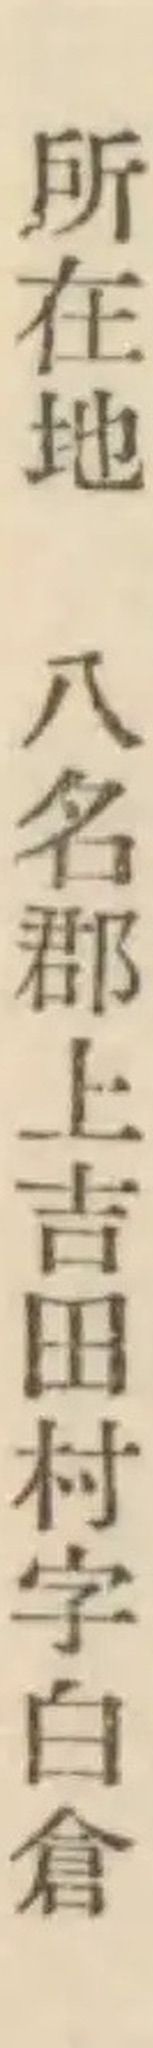所在地八名郡上吉田村字白倉
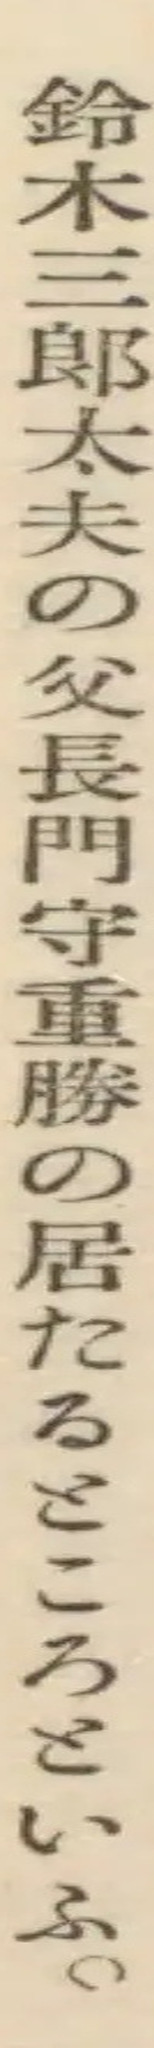鈴木三郎太夫の父長門守重勝の居たるところといふ。
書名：東三河之古城
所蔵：国立国会図書館 National Diet Library, JAPAN
